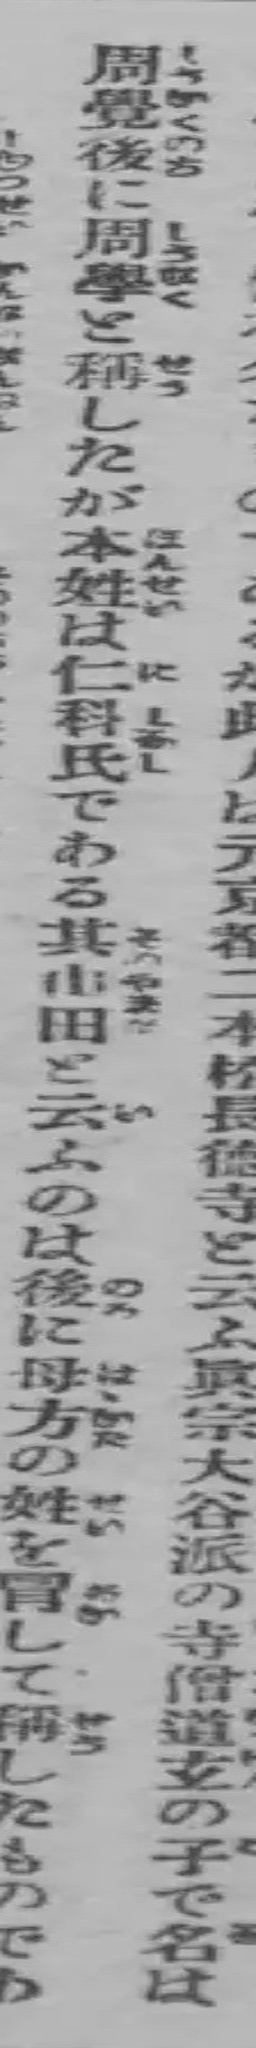周覚後に周学と称したが本姓は仁科氏である其山田と云ふのは後に母方の姓を冒して称したものであ
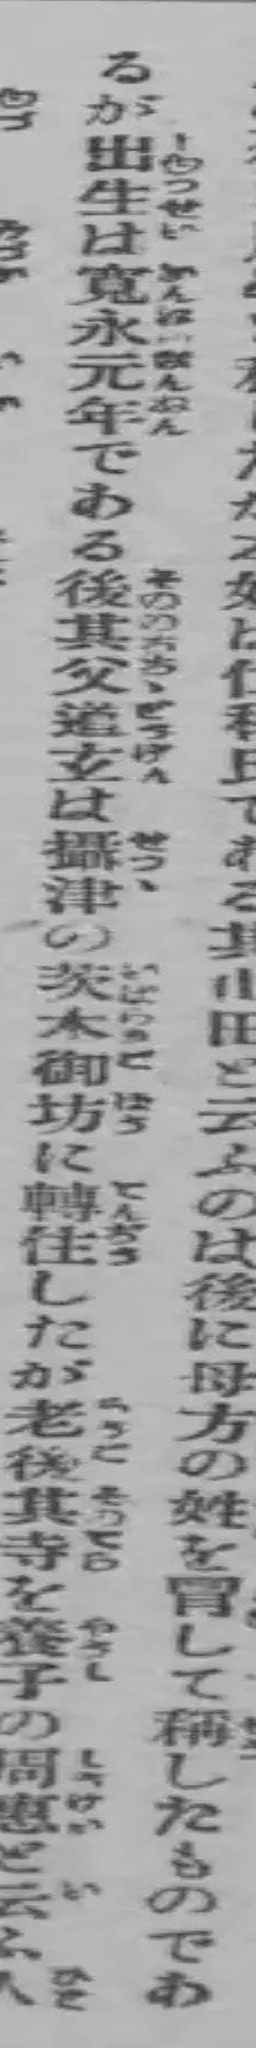るが出生は寛永元年である其後父道玄は摂津の茨木御坊に転住したが老後其寺を養子の周恵と云ふ人
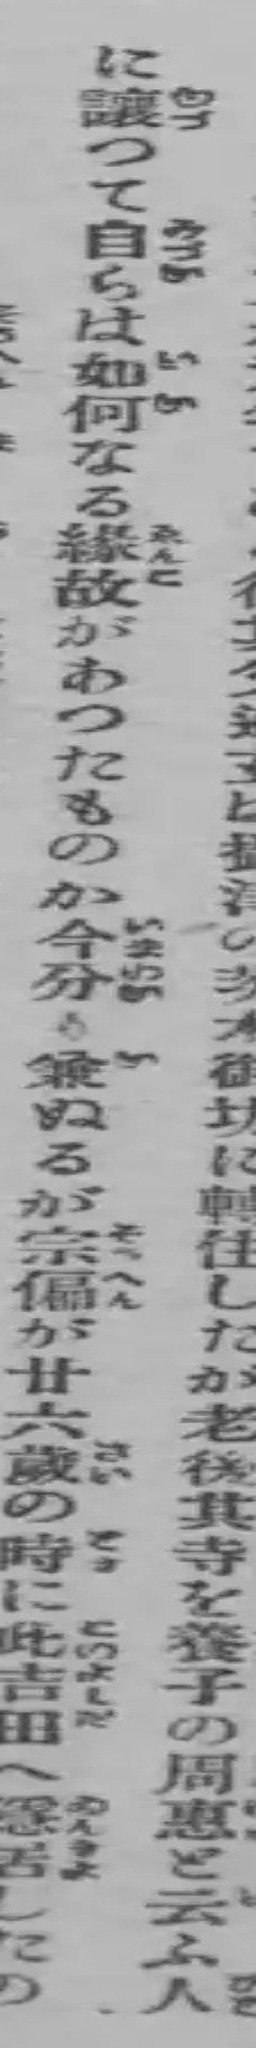に譲つて自らは如何なる縁故があつたものか今分り兼ぬるが宗偏が廿六歳の時に此吉田へ隠居したの
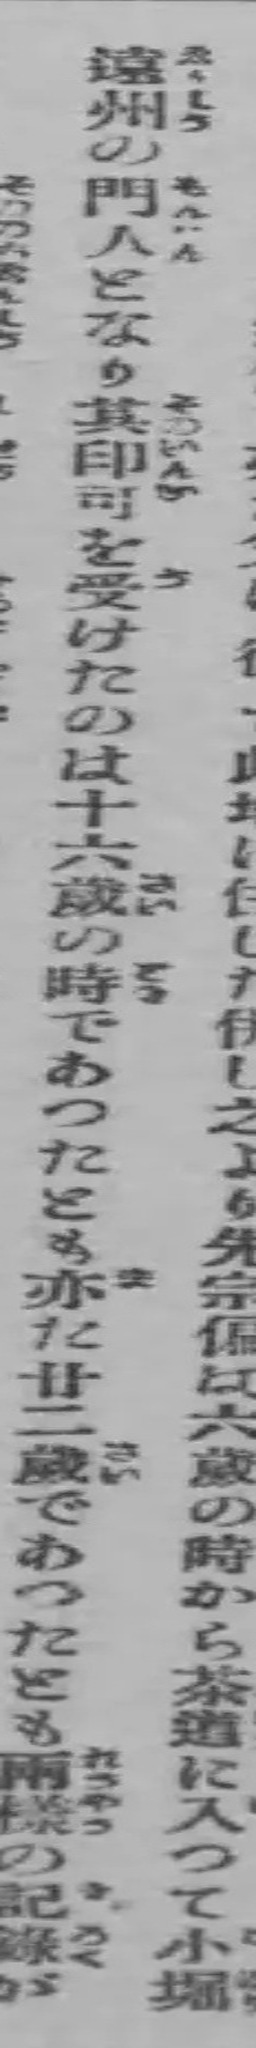遠州の門人となり其印可を受けたのは十六歳の時であつたとも亦た廿二歳であつたとも両様の記録が
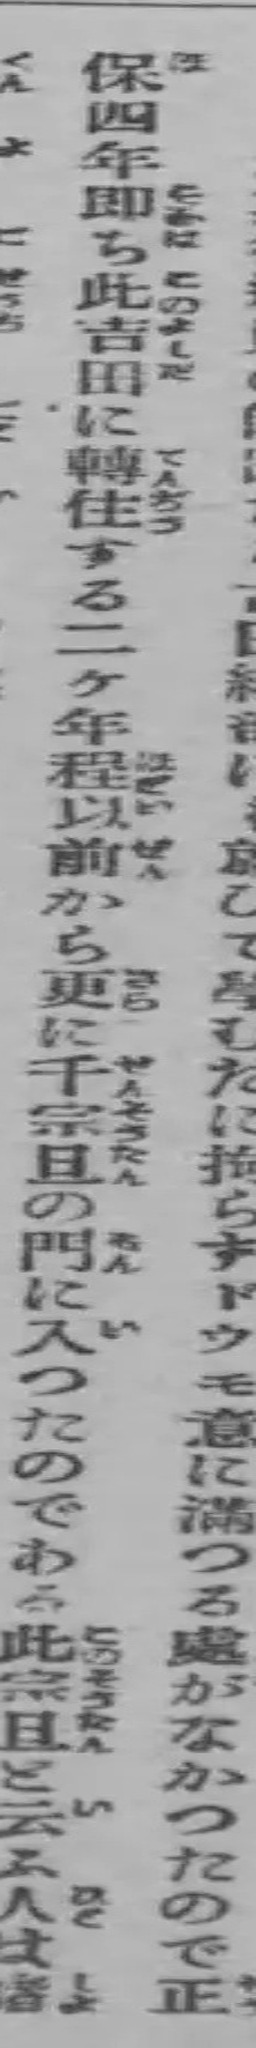保四年即ち此吉田に転住する二ケ年程以前から更に千宗旦の門に入つたのである此宗旦と云ふ人は諸
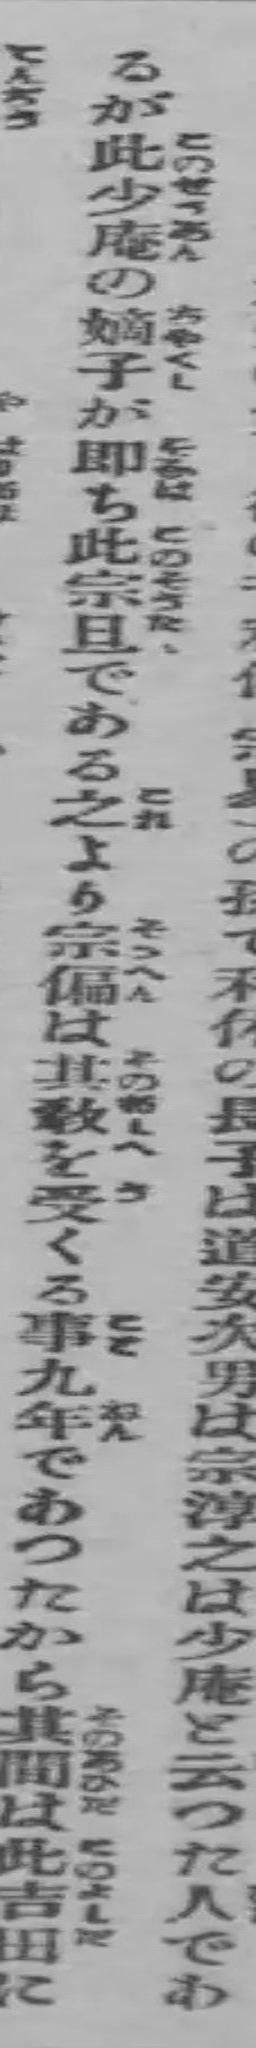るが此少庵の嫡子が即ち此宗旦である之より宗偏は其教を受くる事九年であつたから其間は此吉田に
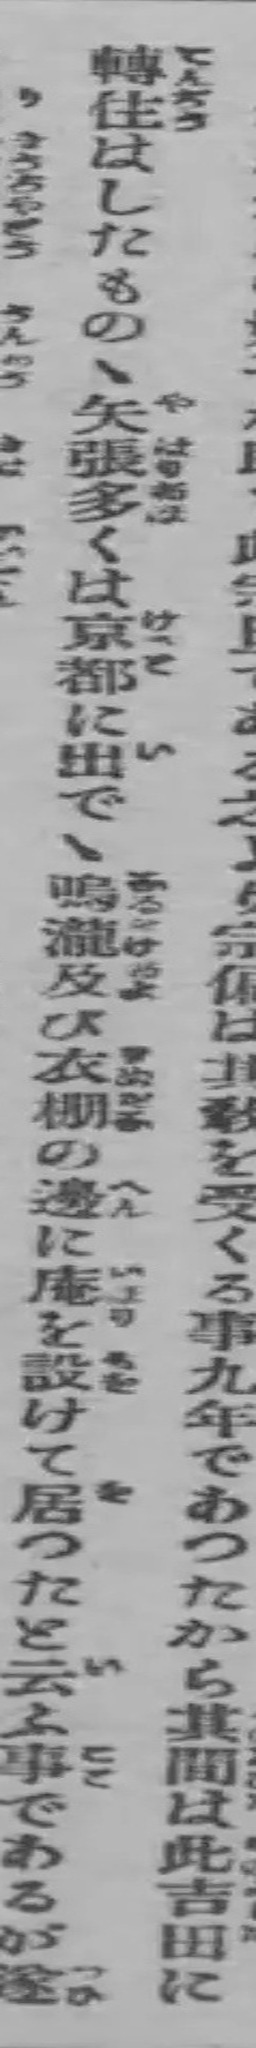転住はしたものゝ矢張多くは京都に出でゝ鳴瀧及び衣棚の辺に庵を設けて居つたと云ふ事であるが遂
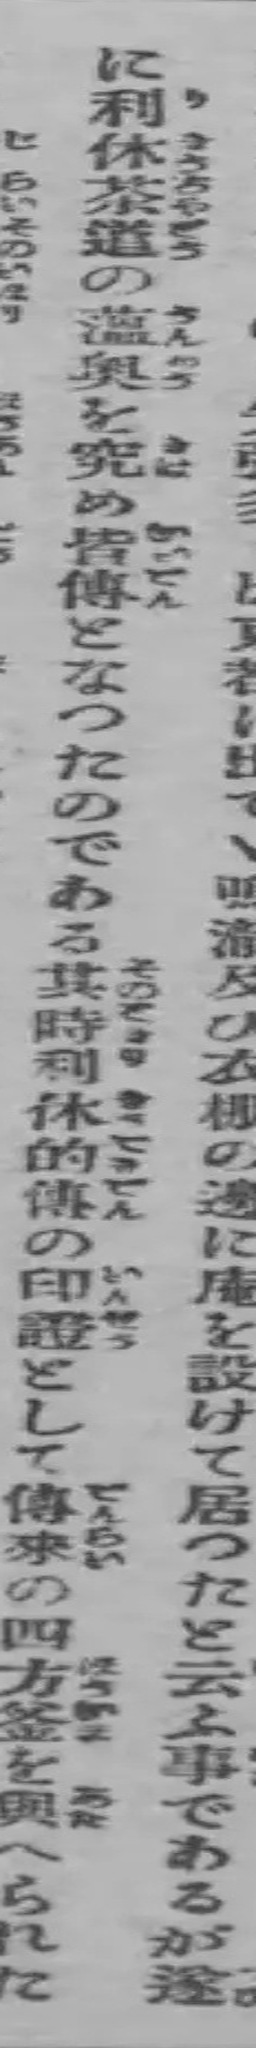に利休茶道の薀奥を究め皆伝となつたのである其時利休的伝の印証として伝来の四方釜を与へられた
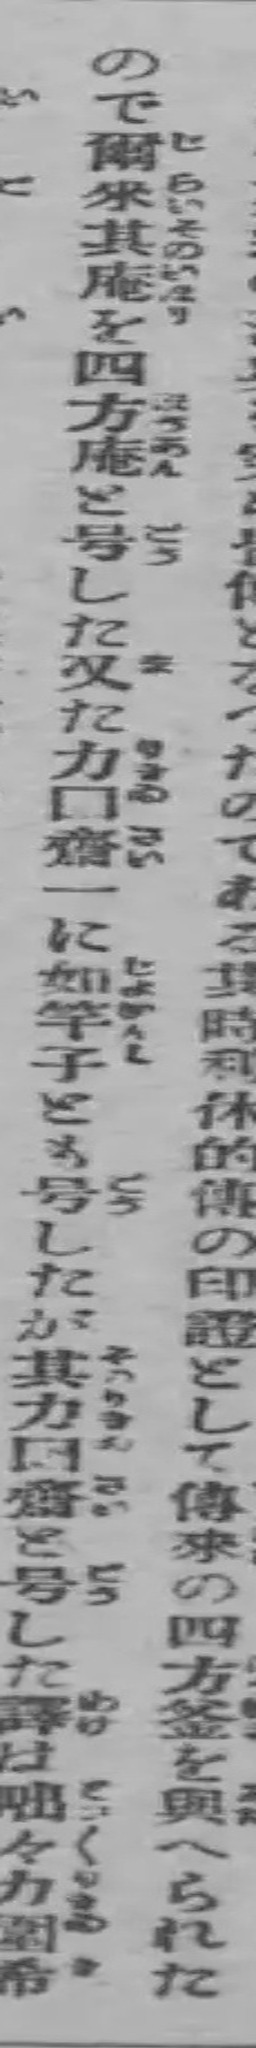力口斉の号ので爾来其庵を四方庵と号した又た力口斉一に如竿子とも号したが其力口斉と号した訳は咄々力囲希
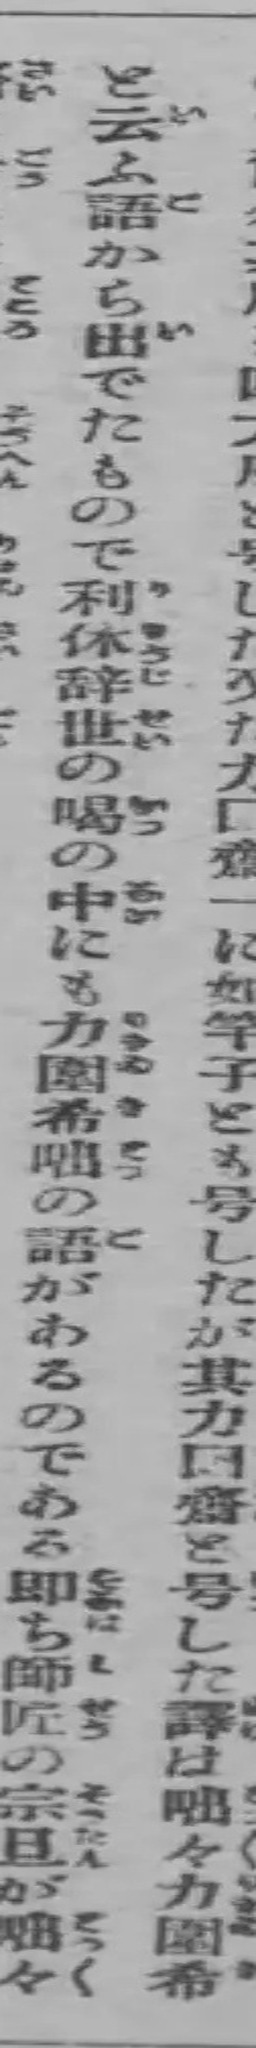と云ふ語から出でたもので利休辞世の喝の中にも力囲希咄の語があるのである即ち師匠の宗旦が咄々
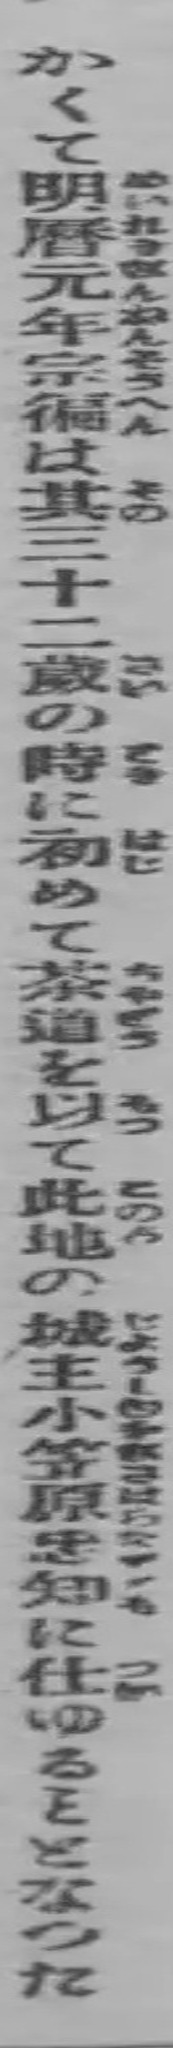かくて明暦元年宗徧は其三十二歳の時に初めて茶道を以て此地の城主小笠原忠知に仕ゆることとなつた
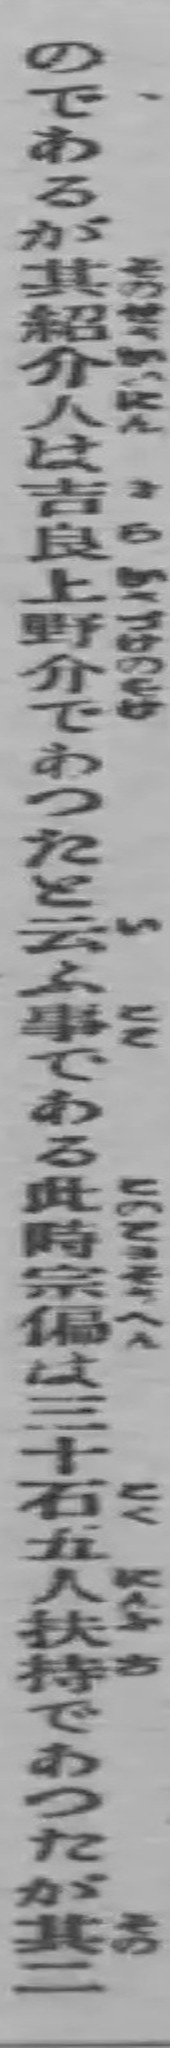のであるが其紹介人は吉良上野介であつたと云ふ事である此時宗偏は三十石五人扶持であつたが其二
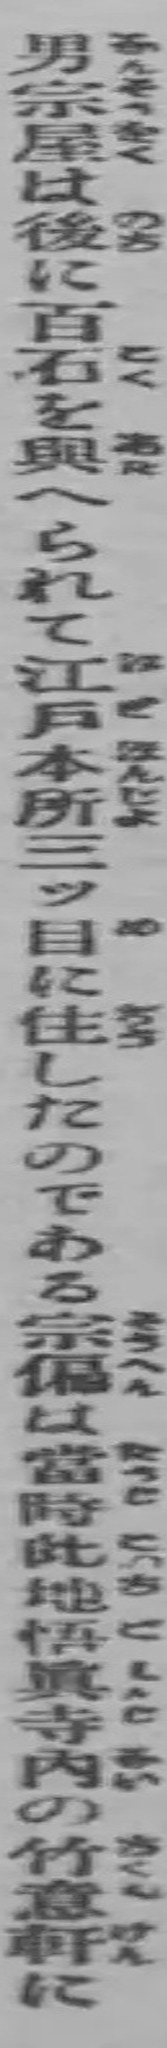男宗屋は後に百石を与へられて江戸本所三ツ目に住したのである宗偏は当時此地悟眞寺内の竹意軒に
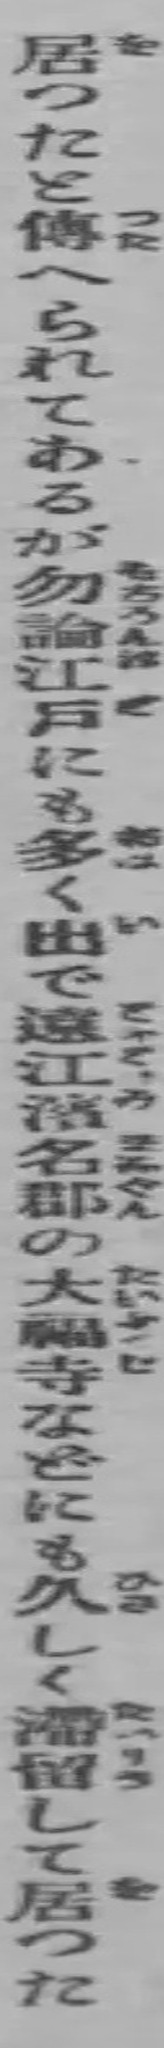居つたと伝へられてあるが勿論江戸にも多く出で遠江浜名郡の大福寺などにも久しく滞留して居つた
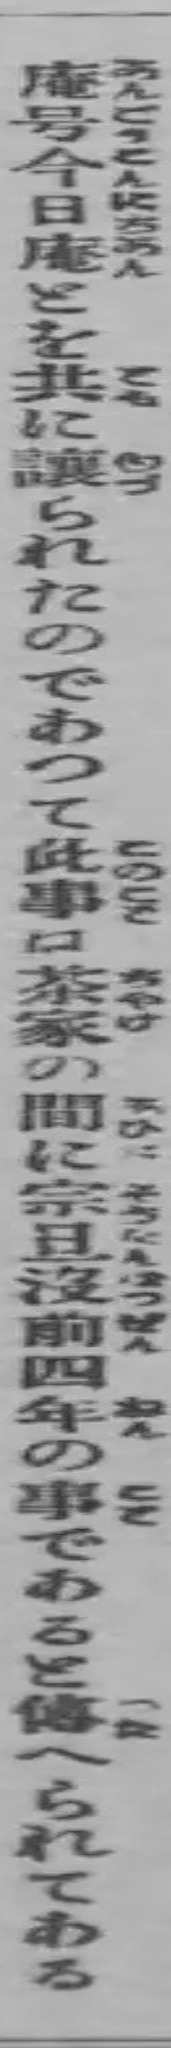庵号今日庵とを共に譲られたのであつて此事は茶家の間に宗旦没前四年の事であると伝へられてある
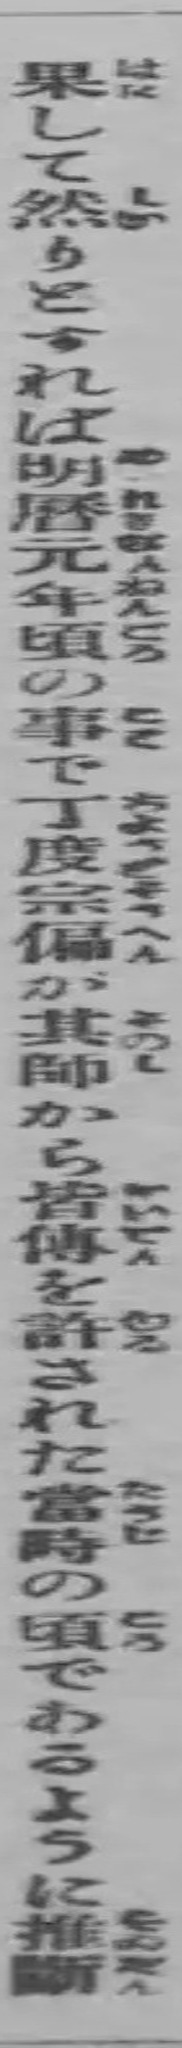果して然りとすれば明暦元年頃の事で丁度宗偏が其師から皆伝を許された当時の頃であるように推断
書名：豊橋市史談
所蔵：国立国会図書館 National Diet Library, JAPAN
